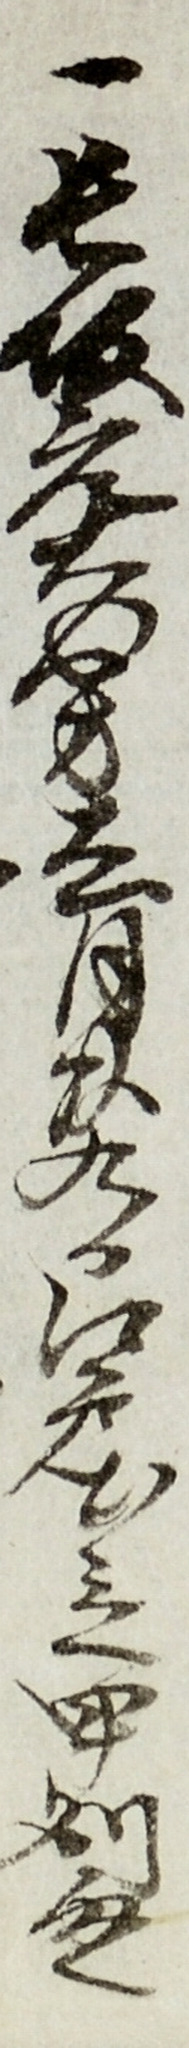一長坂元右衛門方去月廿九日江戸出立甲州通
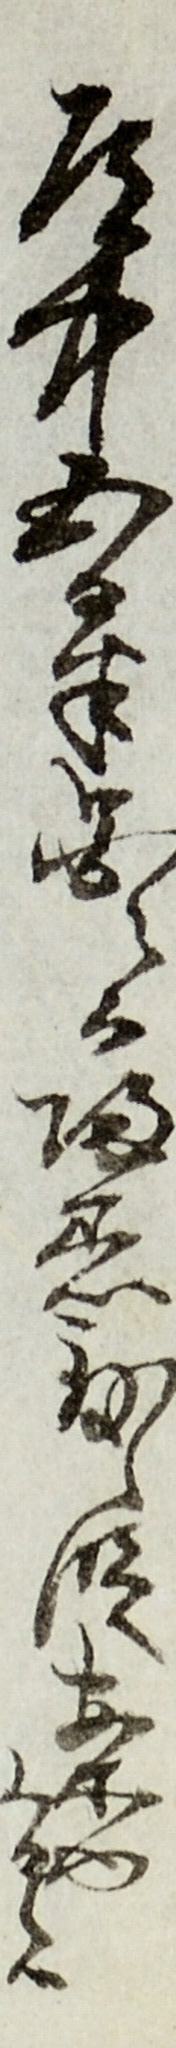道中五日半図ニ而帰着致候段案内有之候
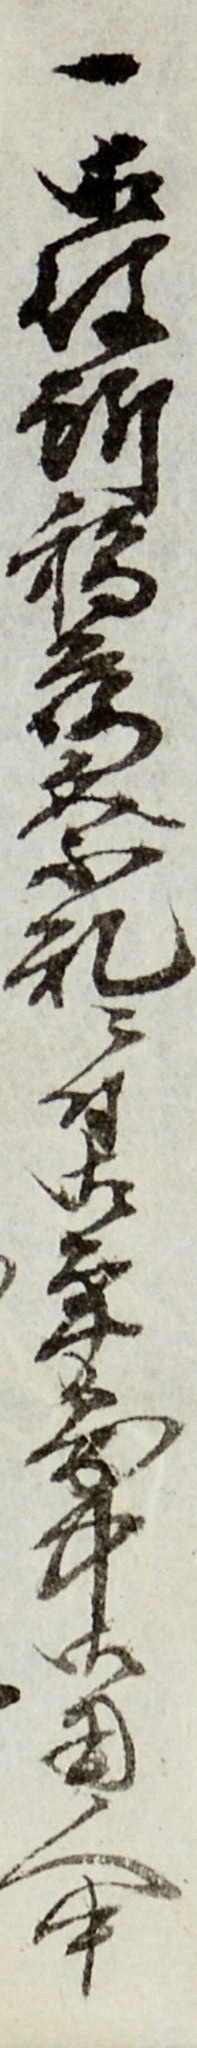一御役所稲荷祭礼ニ付御年寄中御用人中
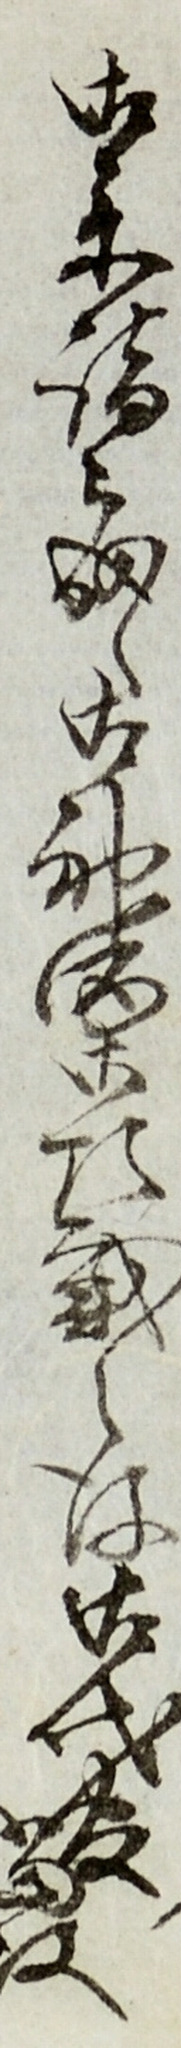御参詣被成候御神酒等頂戴之後御代官当役
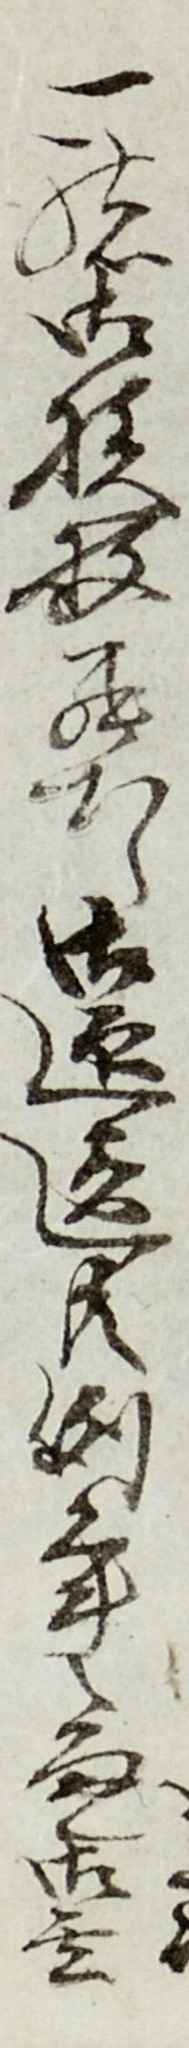一緒御挨拶罷出候御迎送共例年之通御玄
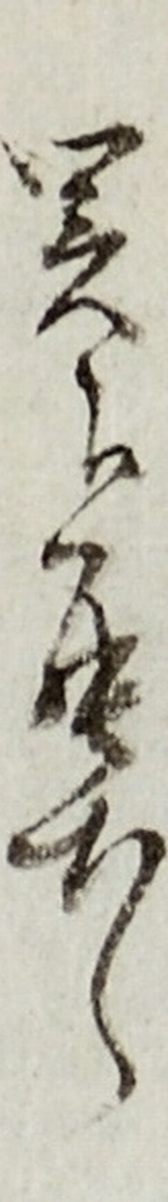関江罷出候
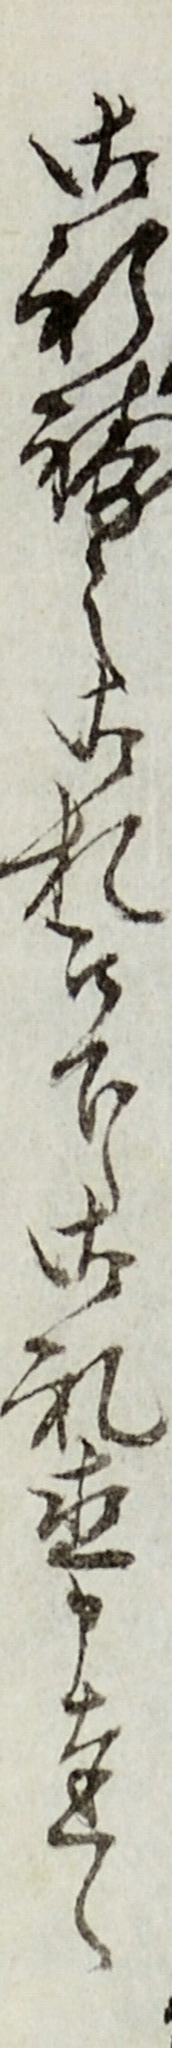御祈祷之御礼被下候御礼直申達候
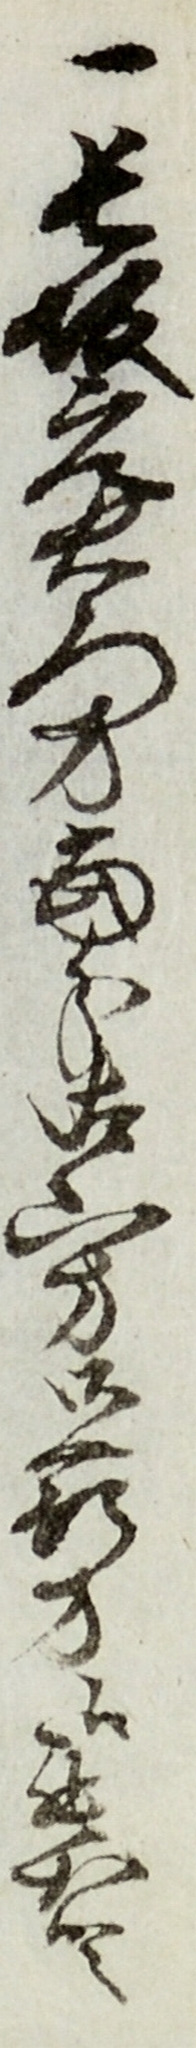一長坂元右衛門方当分御山方御薪方江罷出候ニ
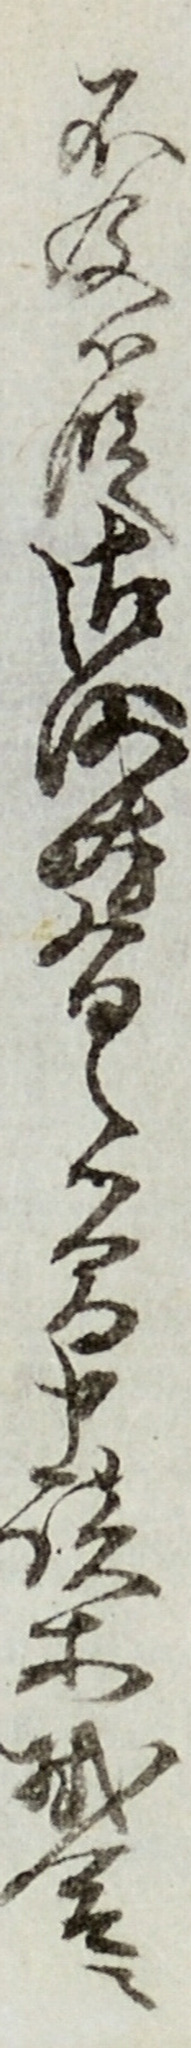不及候段御沙汰有之候間申談等掛合ニ
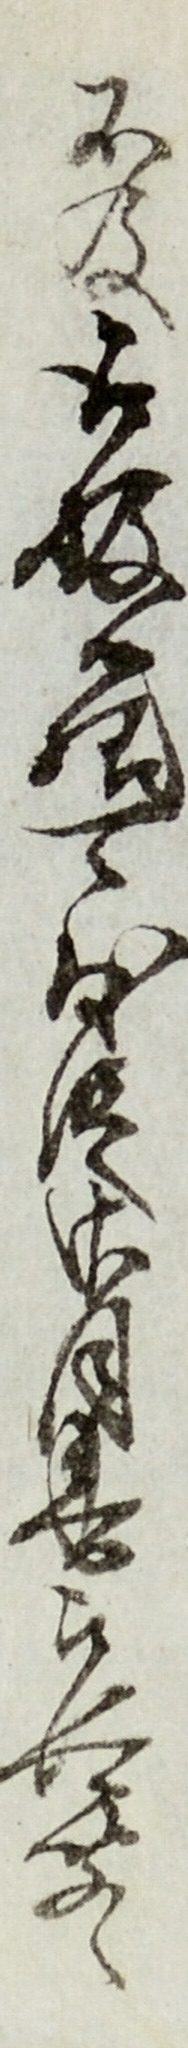不及取扱候様可致段御月番被仰聞候
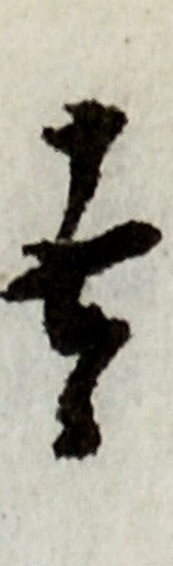十七日
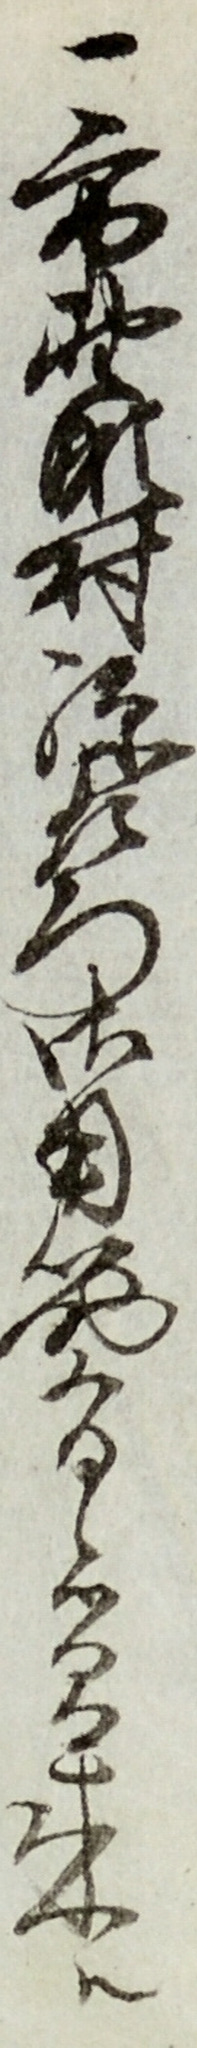一市野瀬村源左衛門御用筋有之候間来ル
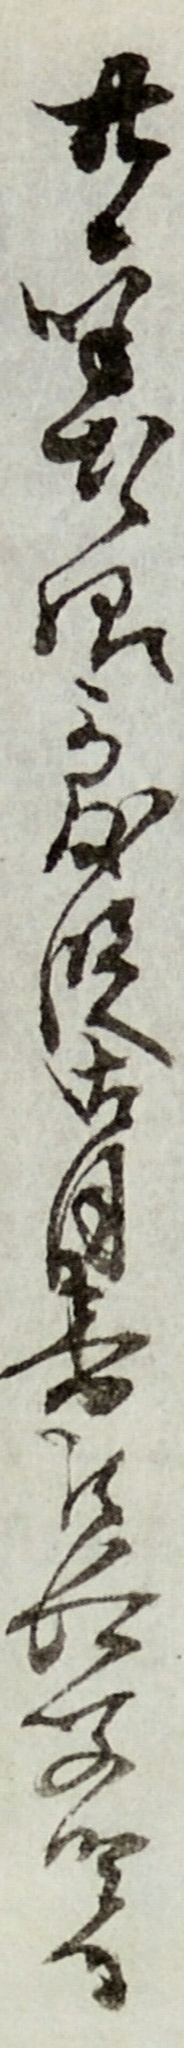廿日呼出候様可致段御月番被仰聞候ニ付
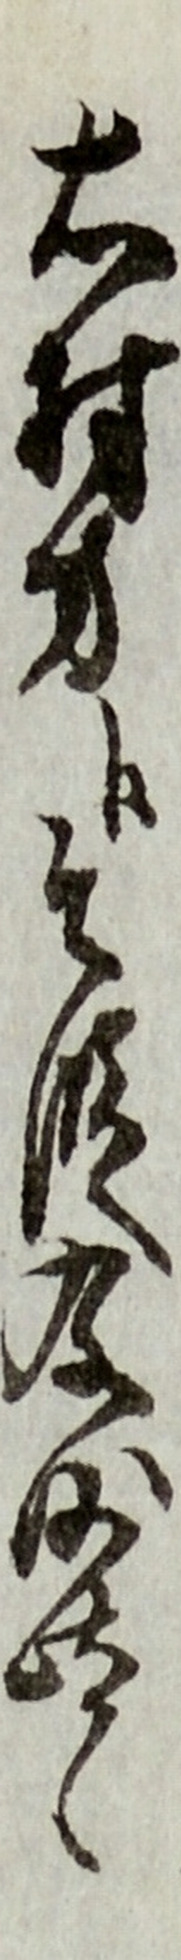右村方江其段及沙汰候
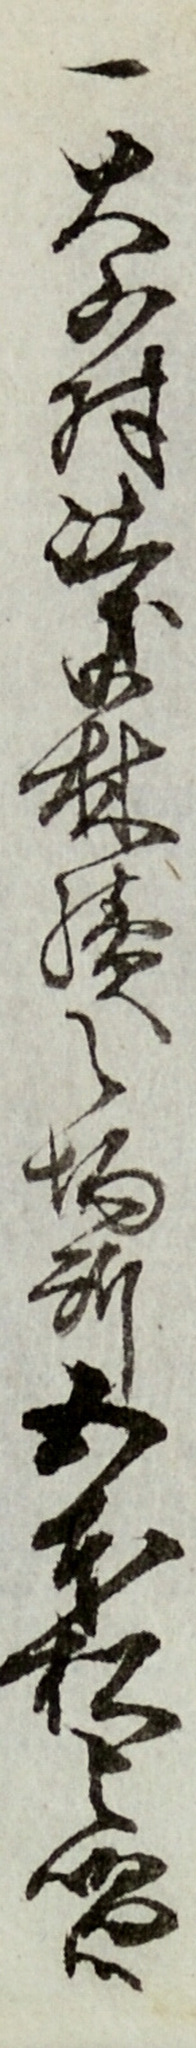一大山村峠御林続之場所五本松与唱候

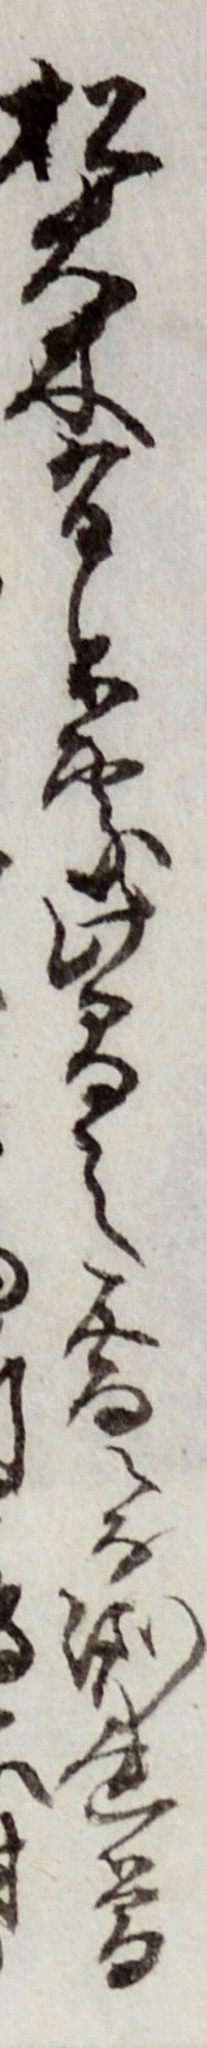松大木有之候処此間之雪ニ而倒れ候間
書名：御山方御薪方諸事御用留
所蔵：伊那市立高遠町図書館・合同会社AMANE
